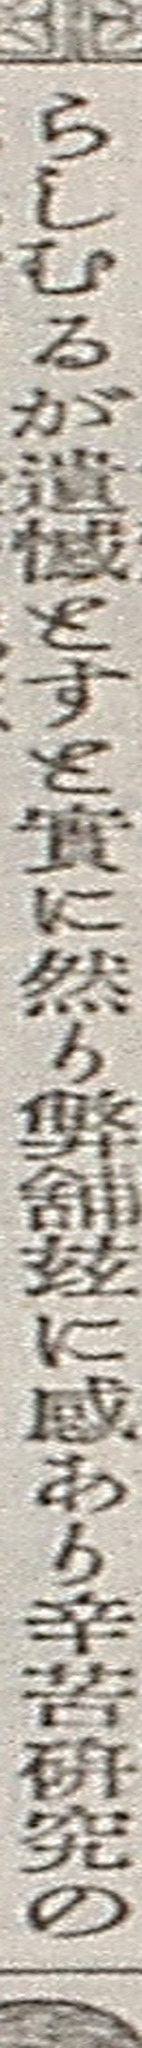らしむるが遺憾とすと実に然り弊舗茲に感あり辛苦研究の
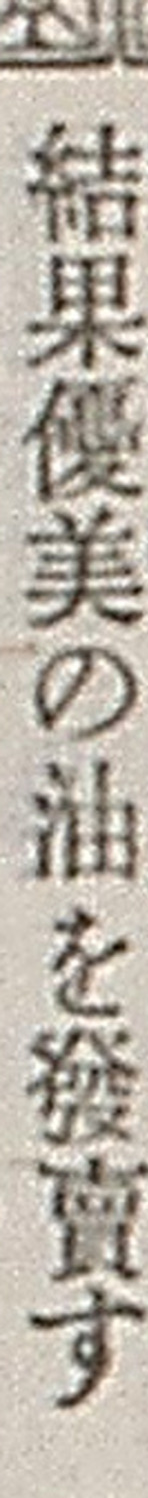結果優美の油を発売す
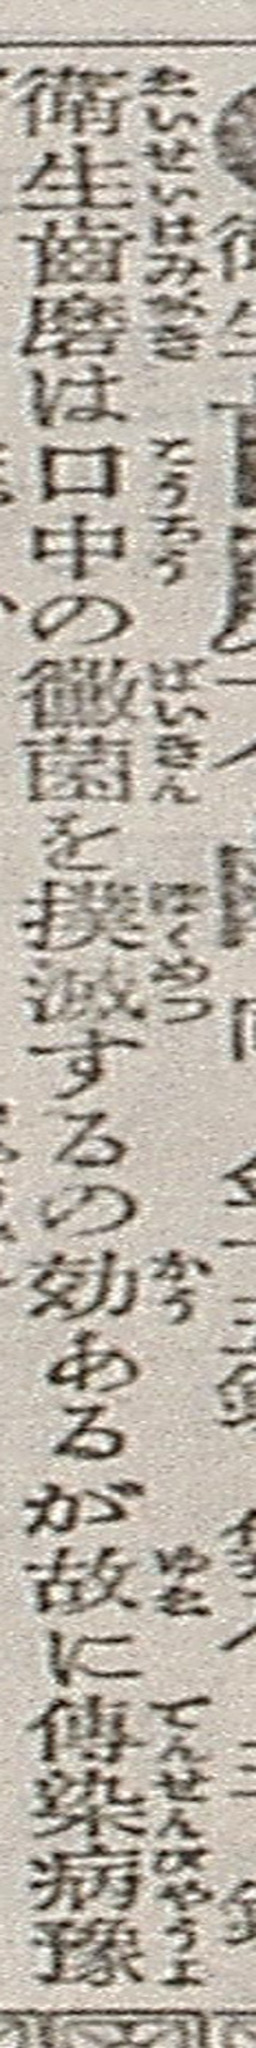衛生歯磨は口中の黴菌を撲滅するの効あるが故に伝染病予
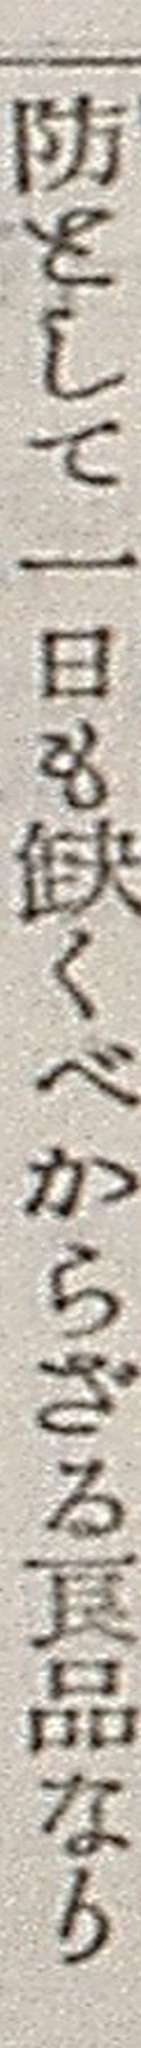防として一日も欠くべからざる良品なり
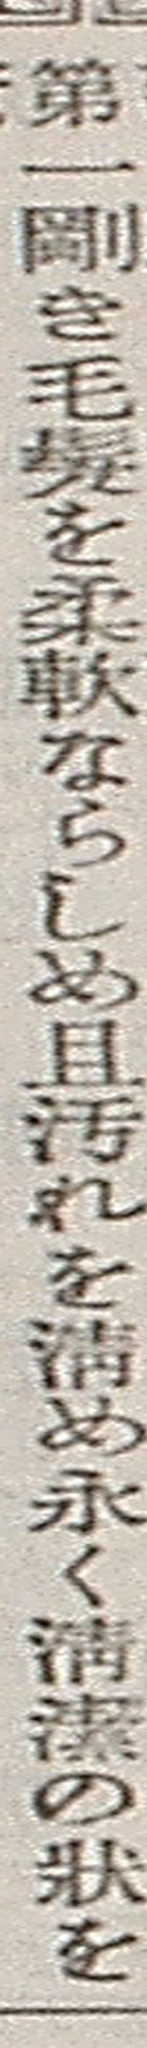第一剛き毛髪を柔軟ならしめ且汚れを清め永く清潔の状を
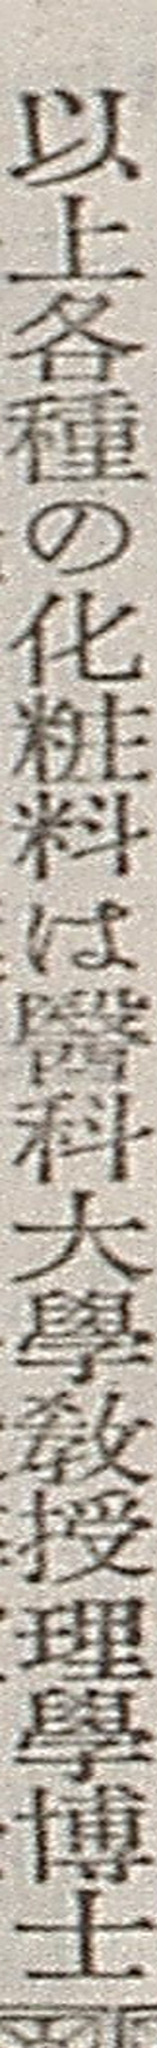以上各種の化粧料は医科大学教授理学博士
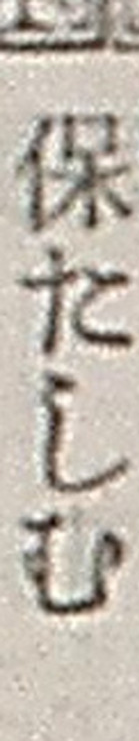保たしむ
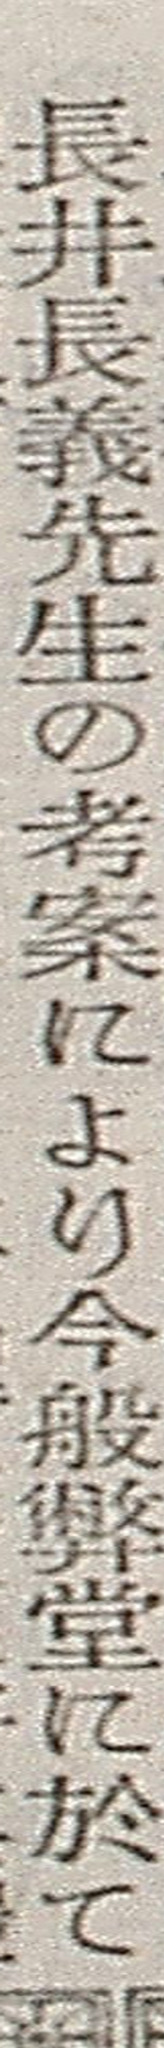長井長義先生の考案により今般弊堂に於て
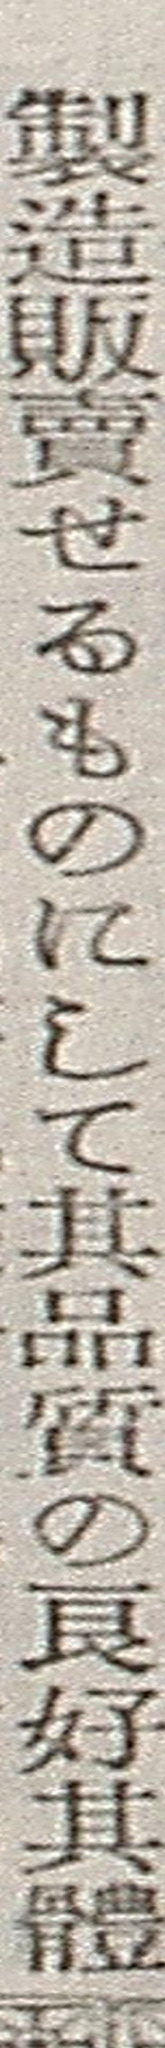製造販売せるものにして其品質の良好其体
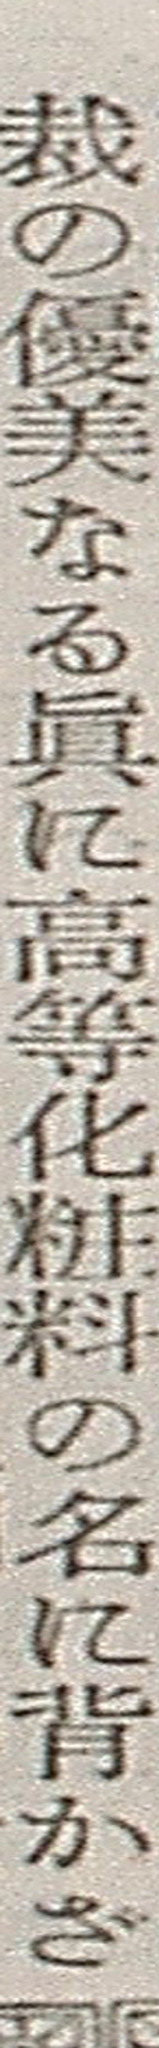裁の優美なる真に高等化粧料の名に背かざ
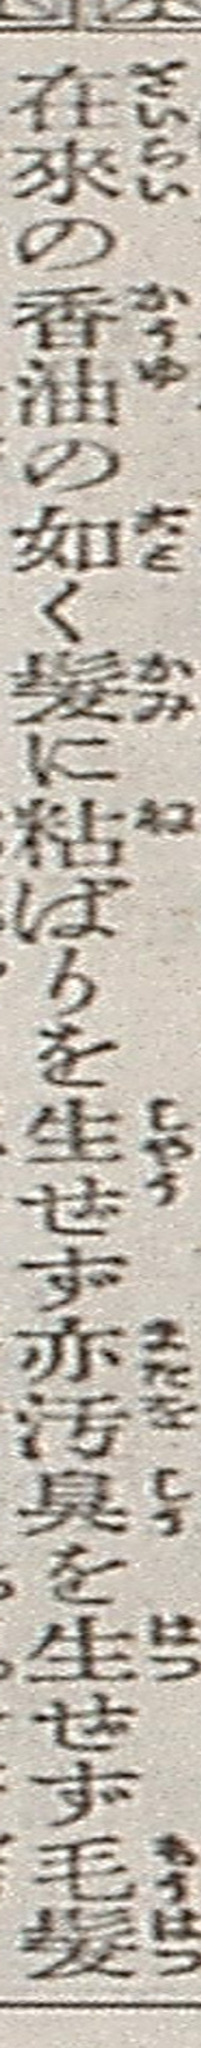在来の香油の如く髪に粘ばりを生ぜず亦汚臭を発ぜず毛髪
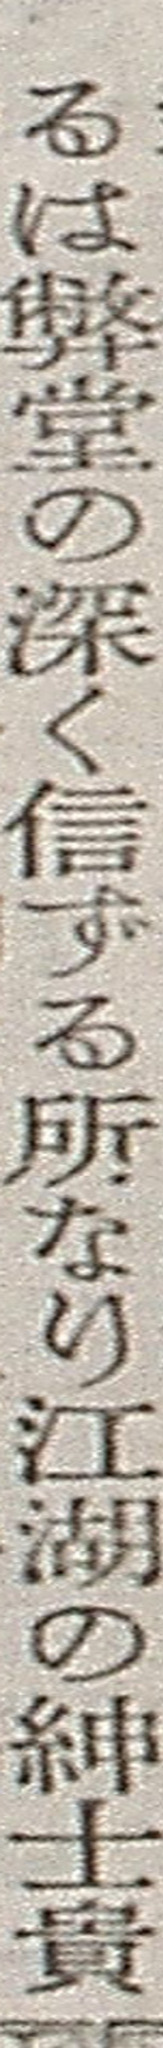るは弊堂の深く信ずる所なり江糊の紳士貴
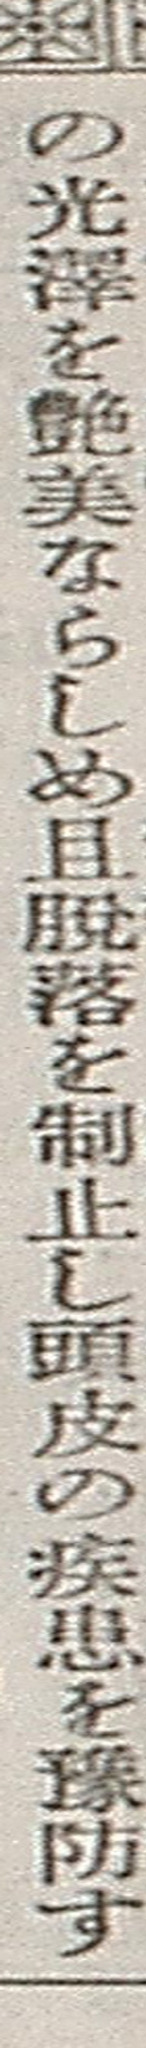の光沢を艶美ならしめ且脱落を制止し頭皮の疾患を予防す
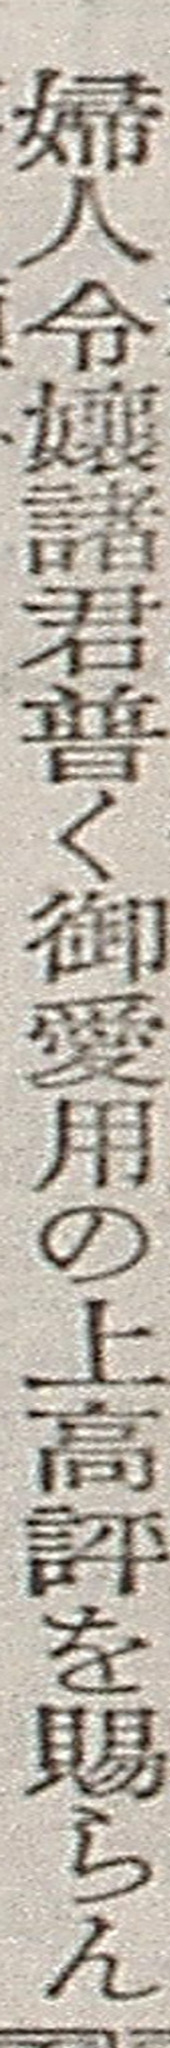婦人令嬢諸君普く御愛用の上高評を賜らん
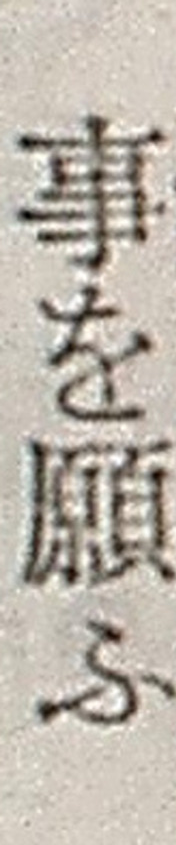事を願ふ
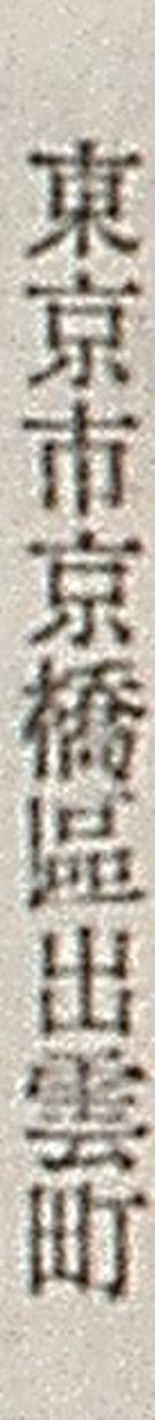東京市京橋区出雲町
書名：風俗畫報臨時増刊第百九十九號　明治三十二年十月各地災害圖會（前編之續）
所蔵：東京大学地震研究所図書室 Earthquake Research Institute Library, The University of Tokyo, JAPAN
